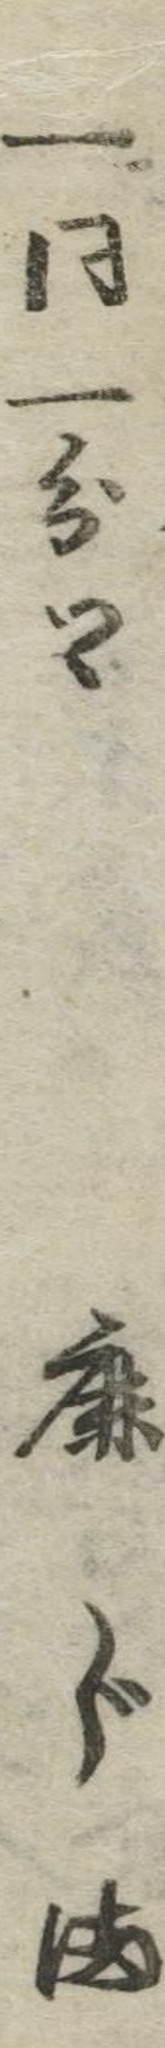一同一分ツゝ廉じま
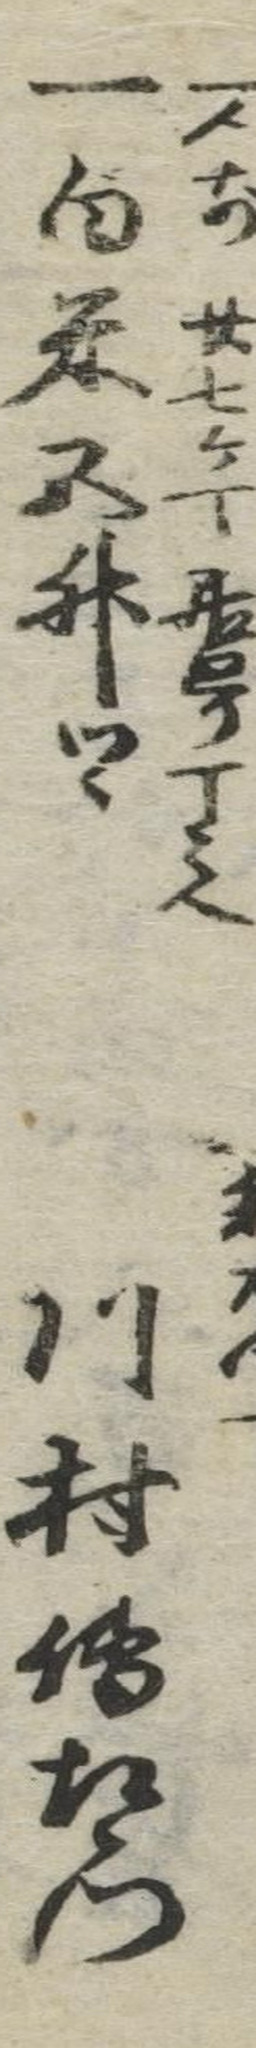一白米五升ツゝ川村伝左衛門
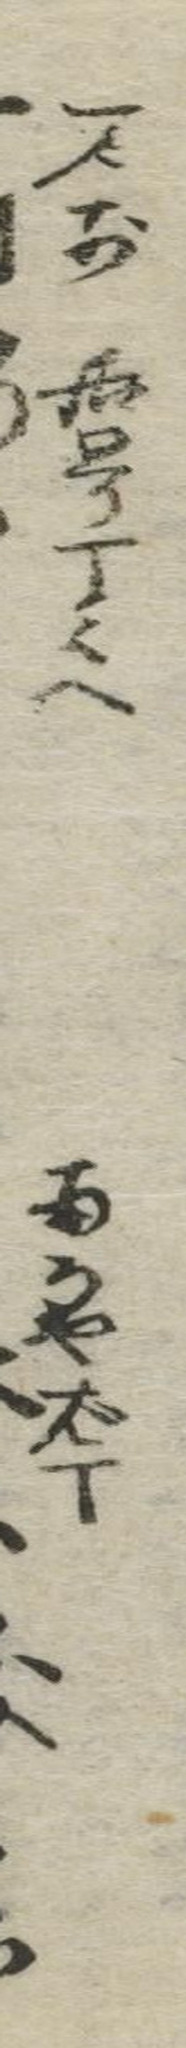一人前居廻り丁々へ南かやば丁
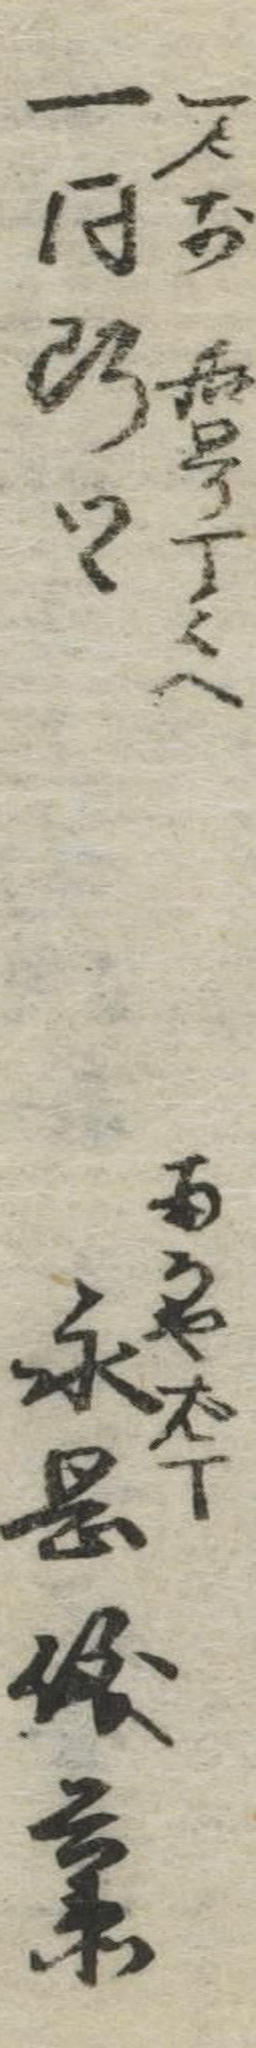一同断ツゝ永岡儀兵衛
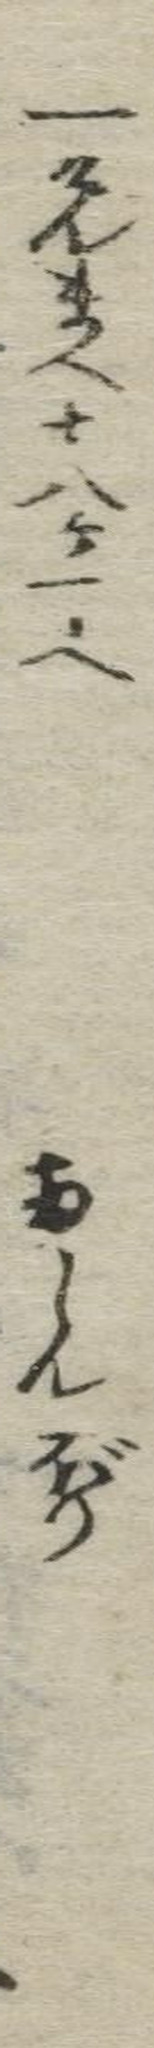一けんまへ十八ヶ丁へ南しんぼり
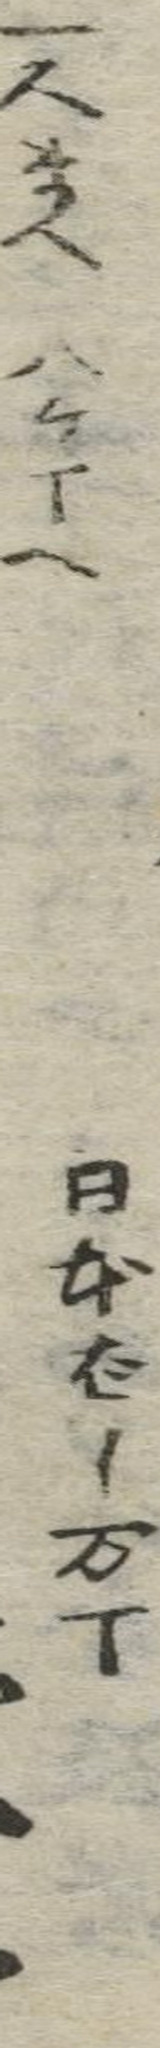一人まへ八ヶ丁へ日本ばし万町
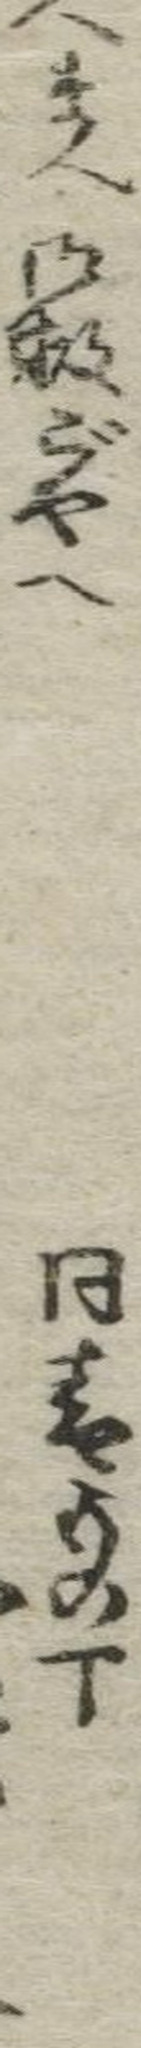一人まへ御救ごやへ同青もの丁
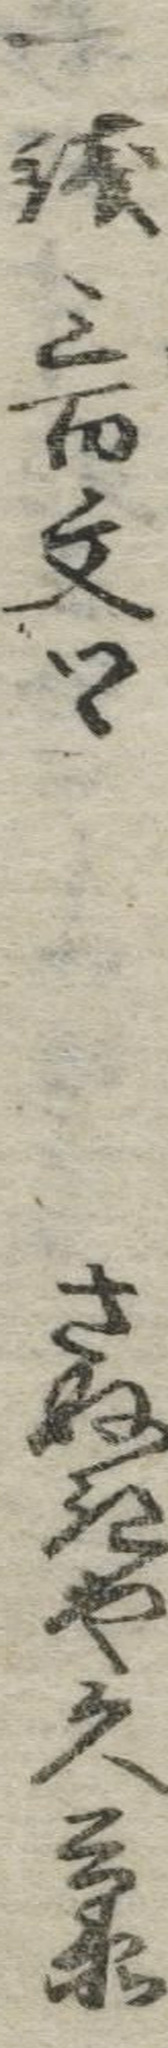一銭三百文ツゝさぬきや久兵衛
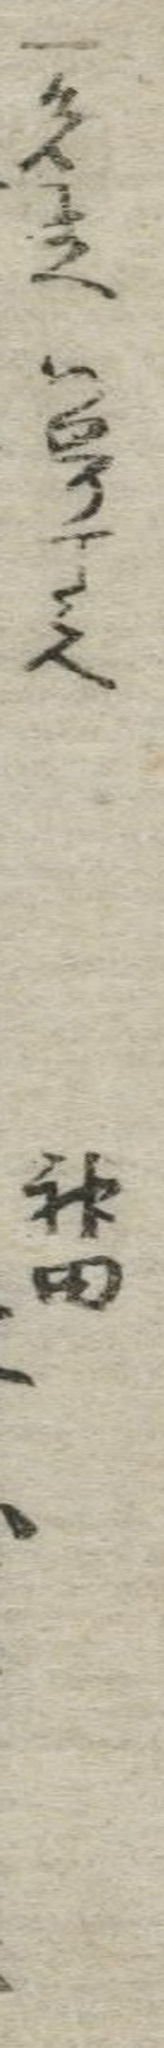一けんまへい廻り丁々へ神田
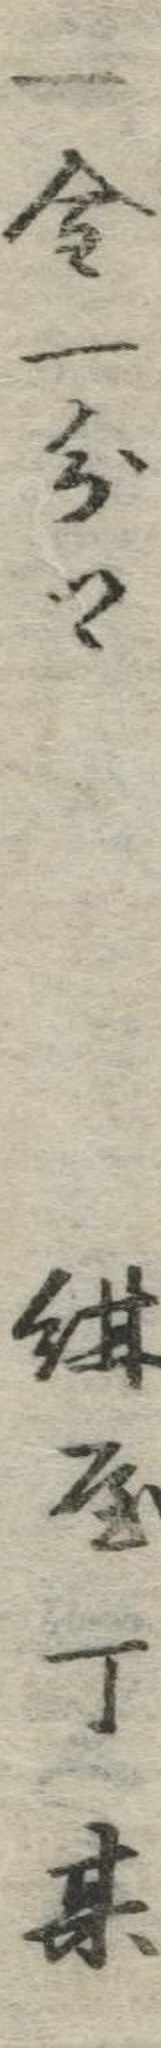一金一分ツゝ紺屋丁某
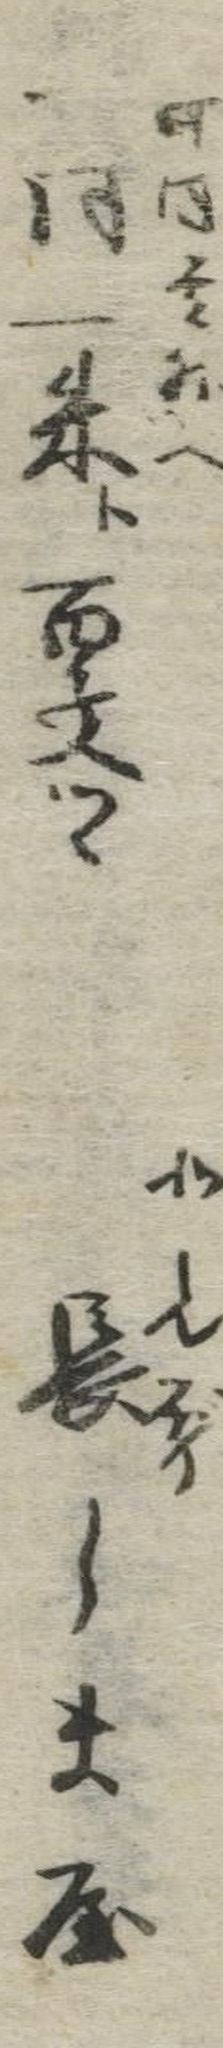一同一朱ㇳ百文ツゝ長しま屋
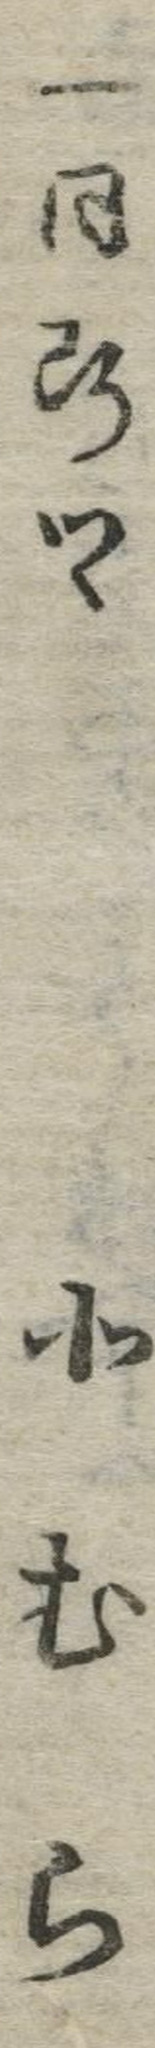一同断ツゝ北むら
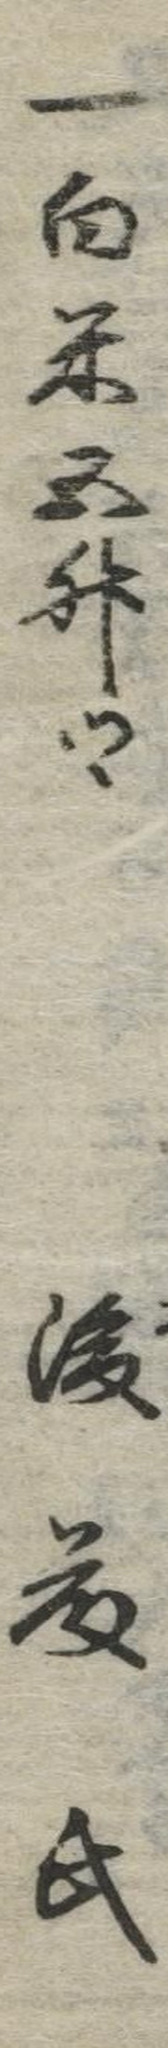一白米五升ツゝ後藤氏
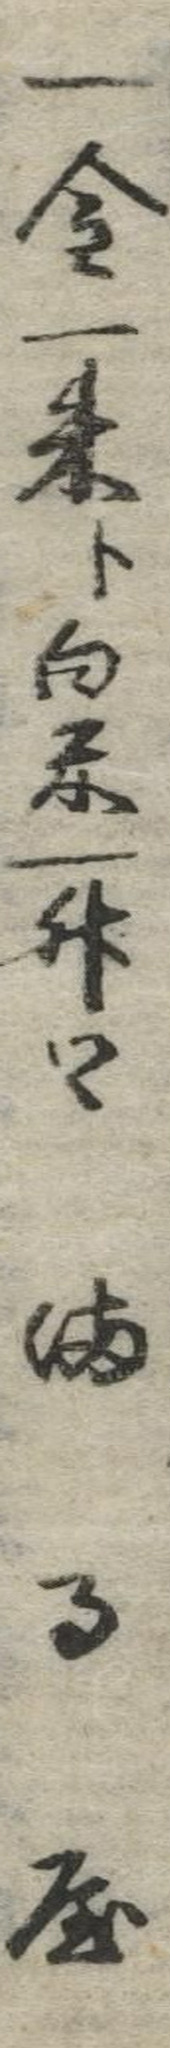一金一朱ㇳ白米一升ツゝまる屋
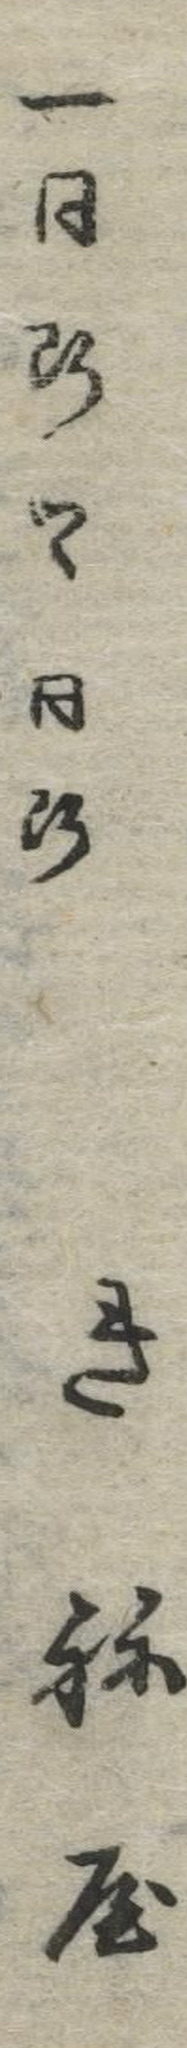一同断ツゝ同断きね屋
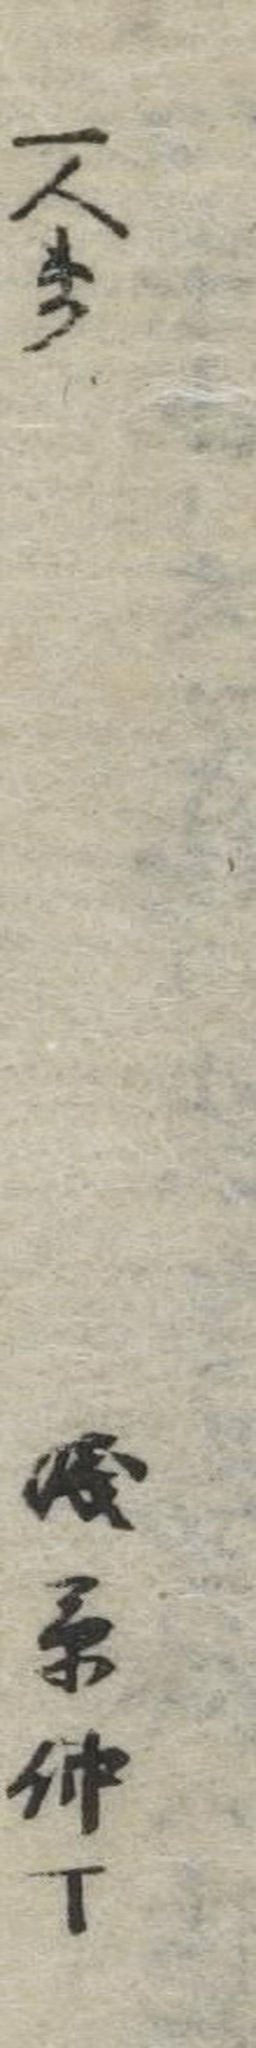一人まへ浅草仲丁
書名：安政二卯十月二日夜四ツ時過　御府内御屋敷方市中共　地震類焼場所明細書之寫　并街道筋近郷聞書
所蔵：東京大学地震研究所図書室 Earthquake Research Institute Library, The University of Tokyo, JAPAN
